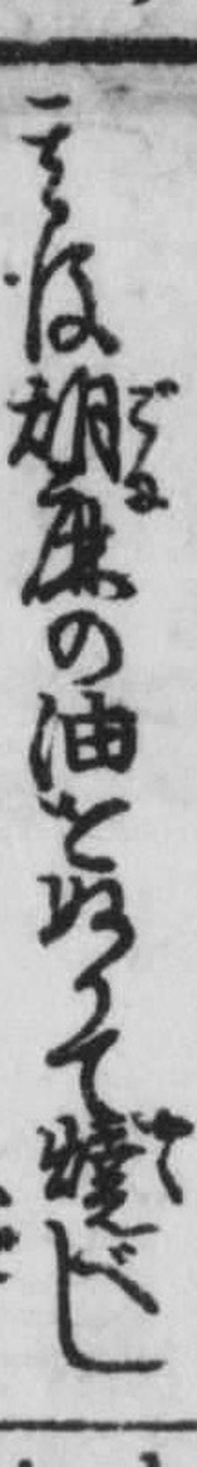其後は胡麻の油をぬりて焼程に
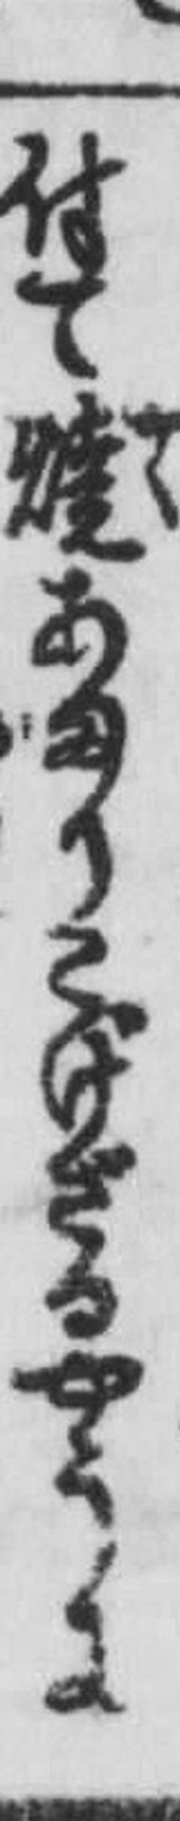付て焼あまりこげざるやうに
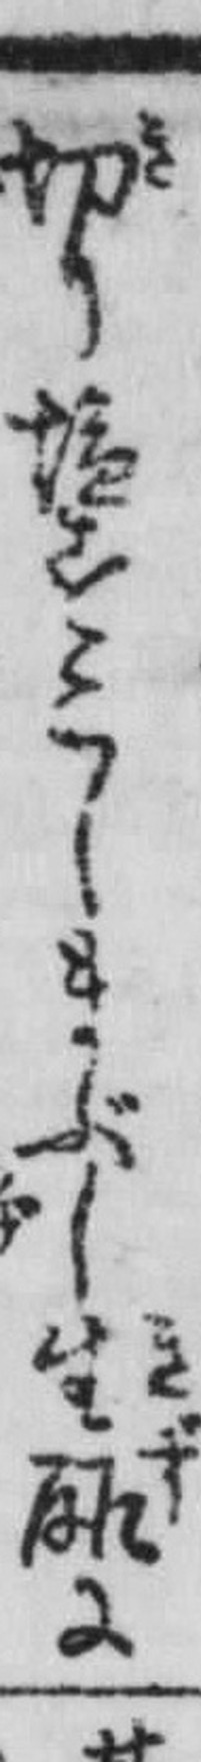切り塩すこしまぶし生酢に
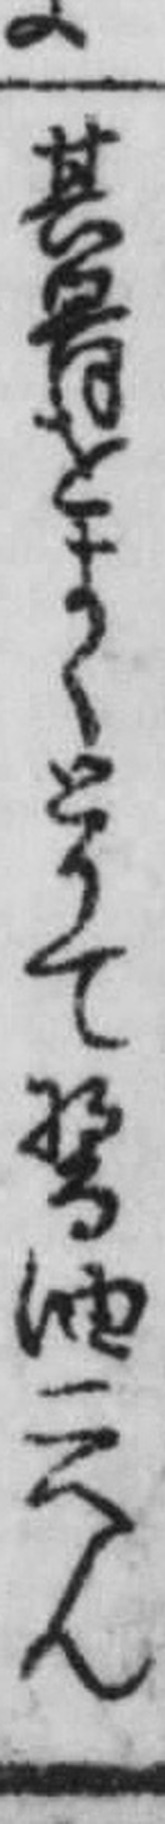其骨をよくとりて醤油二へん
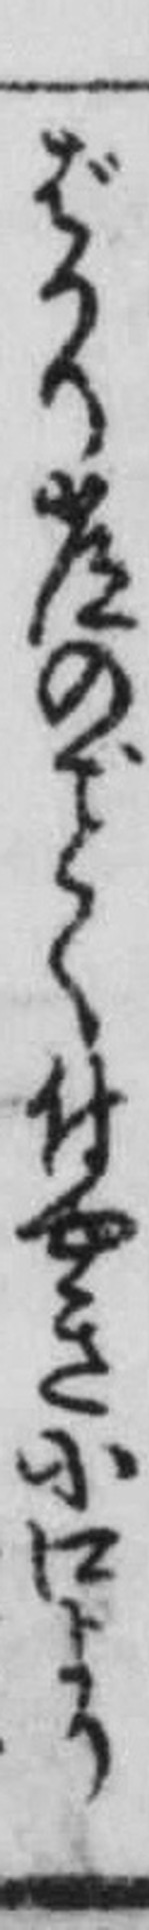ばかり常のごとく付やき小口より
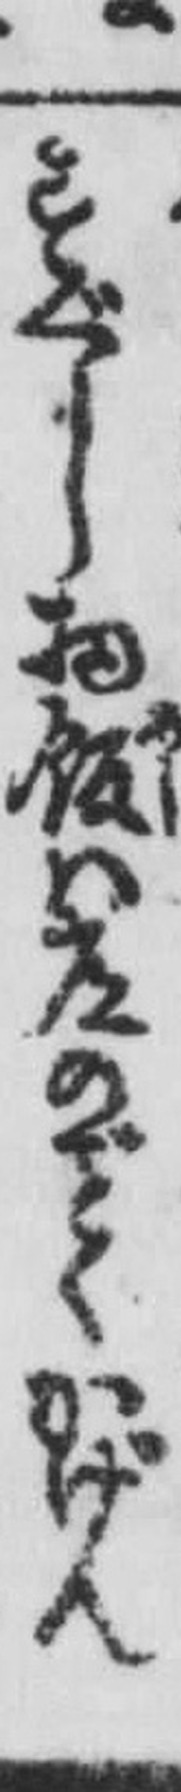すべし扨飯は常のごとくかげん
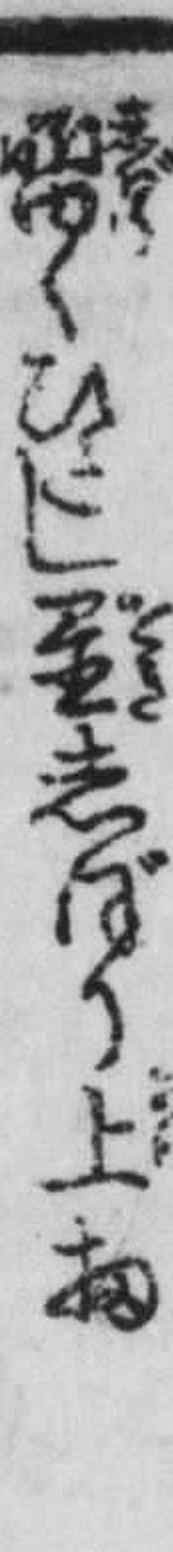暫くひたし置しぼり上扨
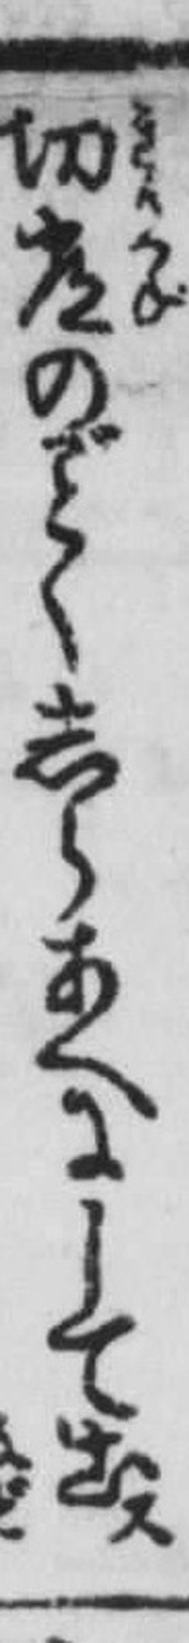切常のごとくしらあへにして出す
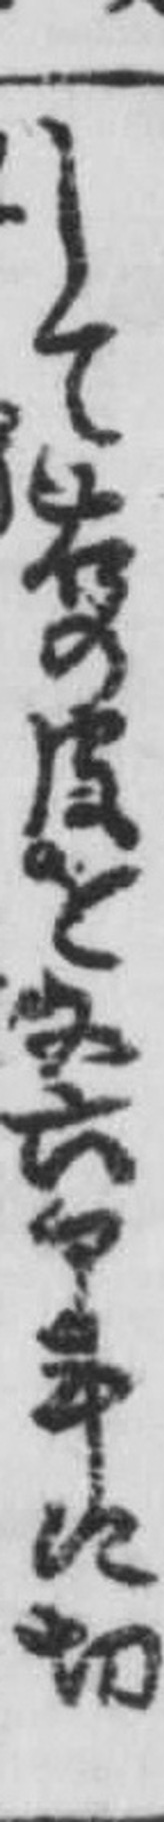して右の皮を五六部斗に切
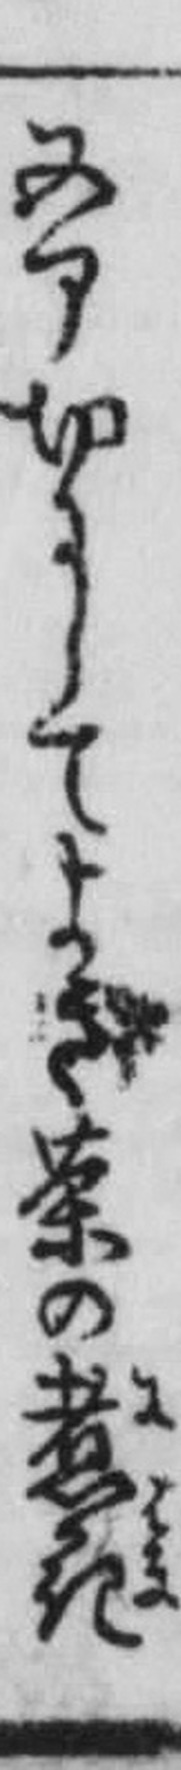五部切にしてよき茶の煮花
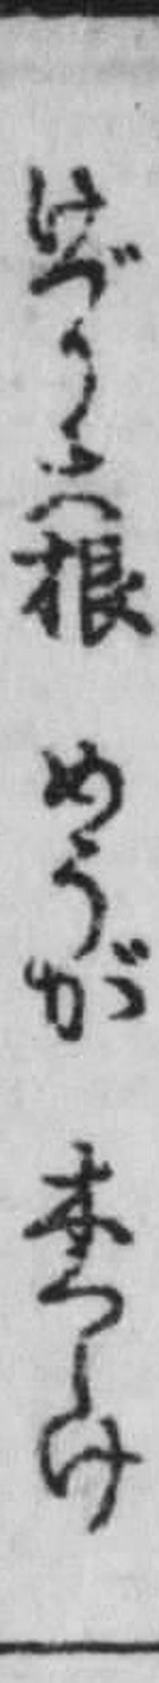けづり大根めうが木くらけ
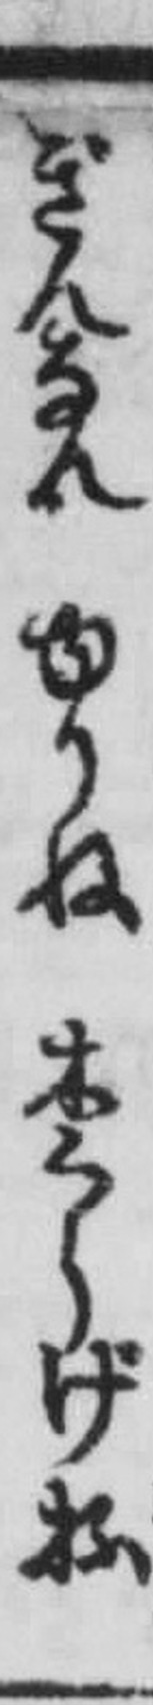ぎんなんゆりねきくらげ抔
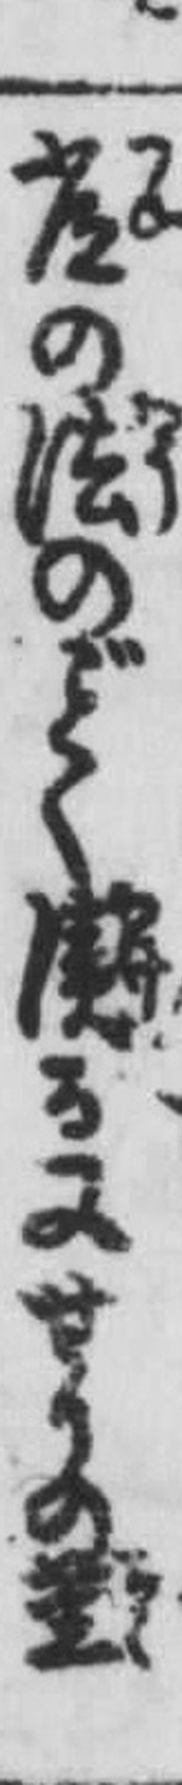常の法のごとく漬る又せりの茎？
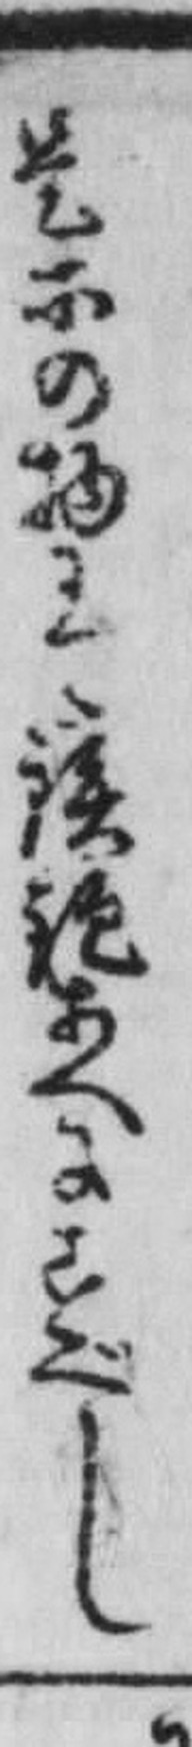是等の物にて鉄砲あへにすべし
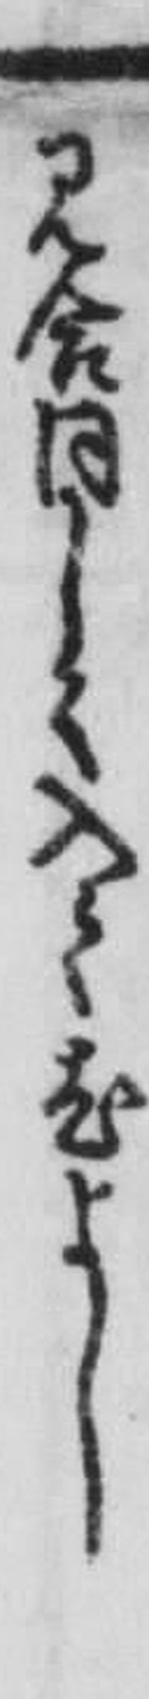見合同しく入て尤よし
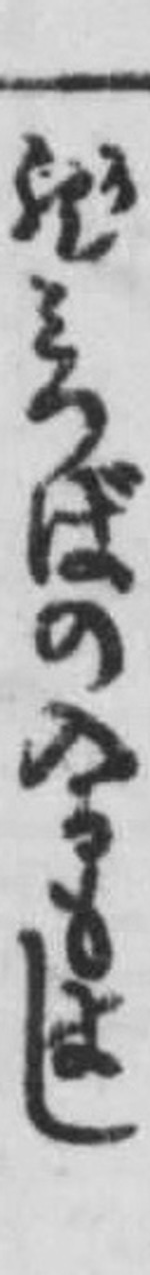歟みつばの入るもよし
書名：精進魚類間合料理/早速庖丁
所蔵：大阪府立大学学術情報センター 国文学研究資料館
